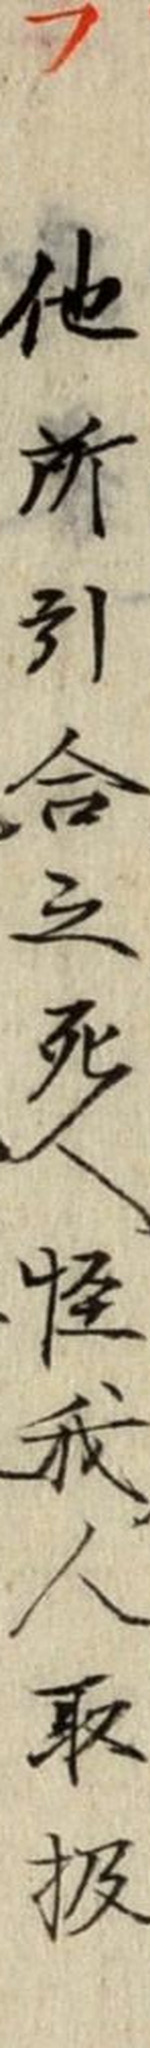ラ他所引合之死人怪我人取扱
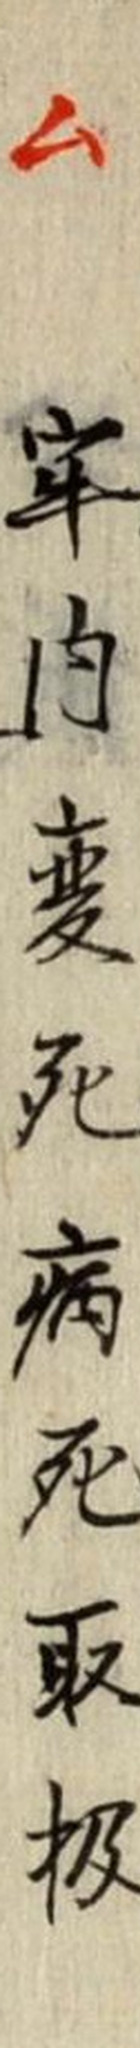ム牢内変死病死取扱
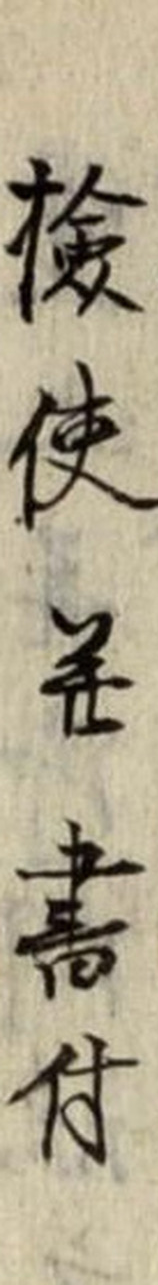ウ検使并書付
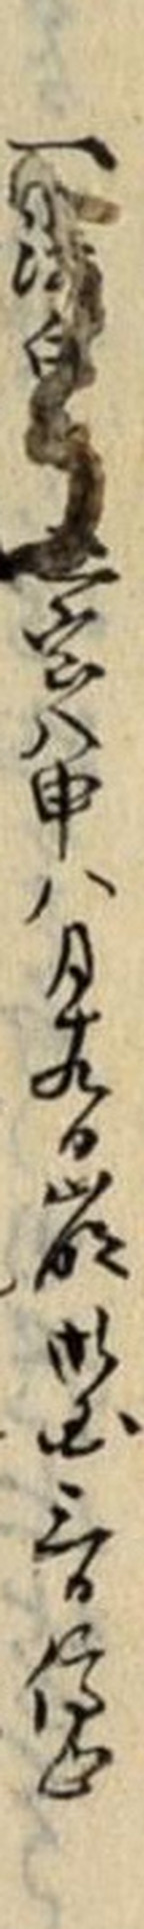一法皇延宝八申八月十九日崩御国三日停止
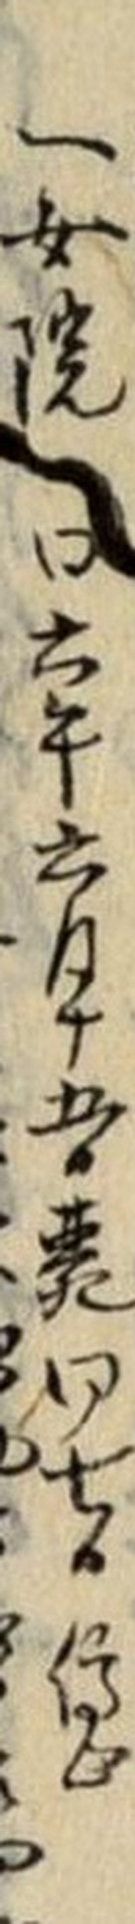一女院同六午六月十五日薨同七日停止
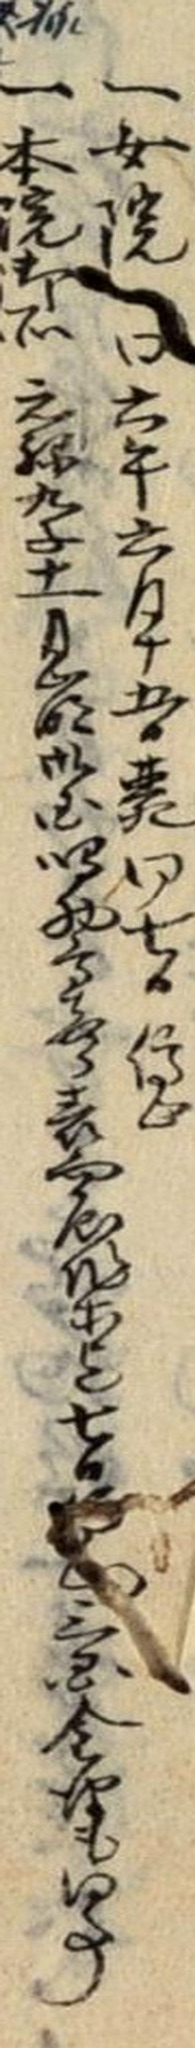一本院御所元禄九子十一月崩御御国鳴物高声表向家作等迄七日停止三国金津も同事
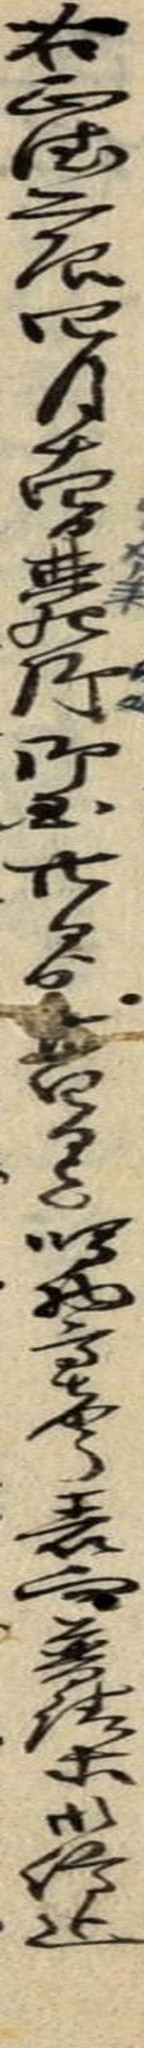右正徳二辰四月十四日薨御御国廿日ゟ廿四日迄鳴物高声表向普請等御停止
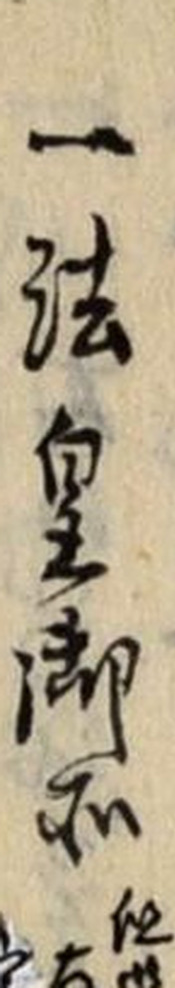一女院御所
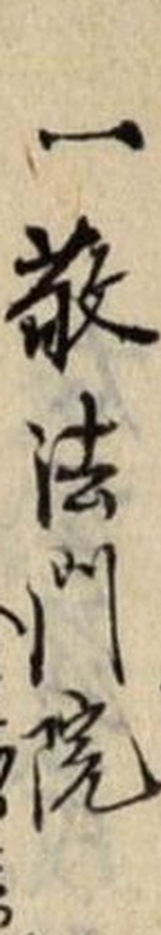一敬法門院
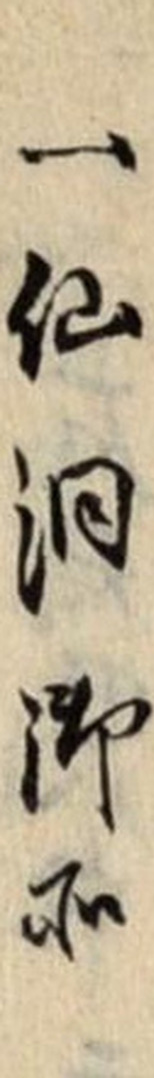一仙洞御所
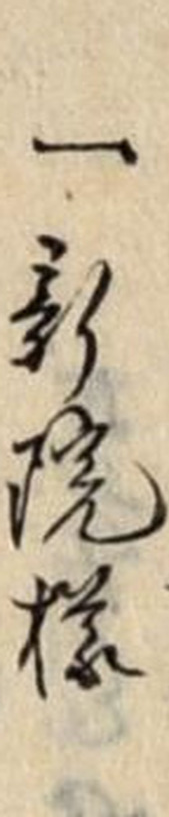一新院様
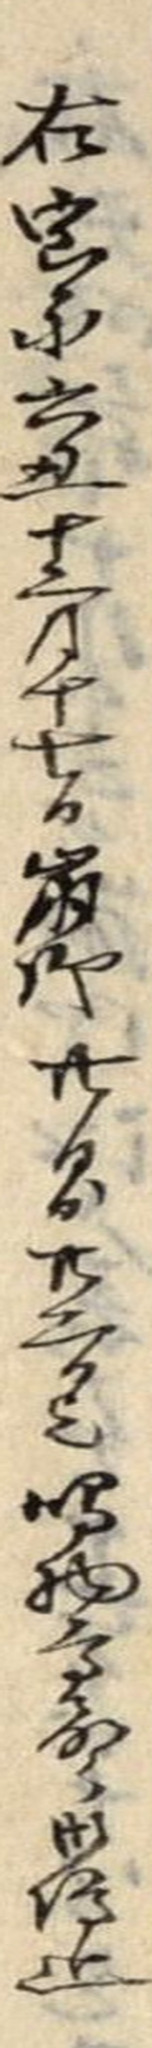右宝永六丑十二月十七日崩御廿日ゟ廿二日迄鳴物高声御停止
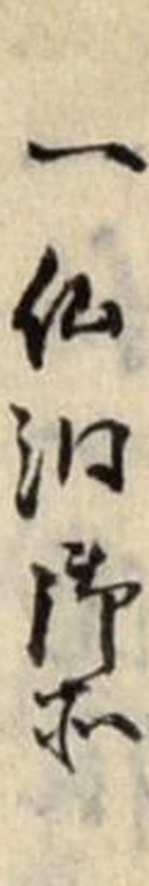一仙洞御所
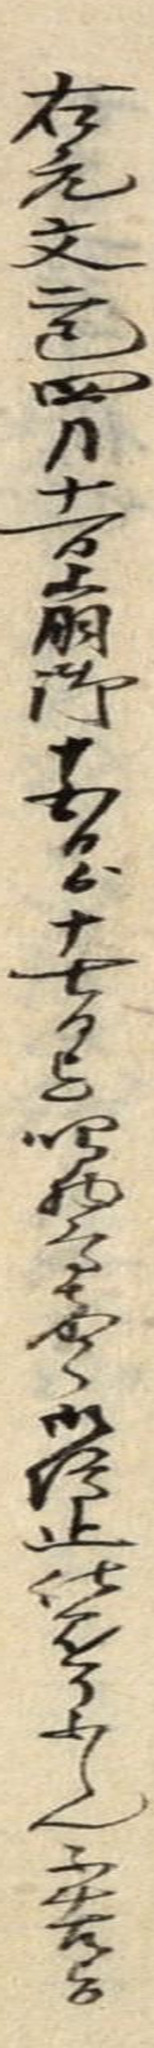右元文二巳四月十一日崩御十五日ゟ十七日迄鳴物高声御停止仕懸りふしん不苦旨
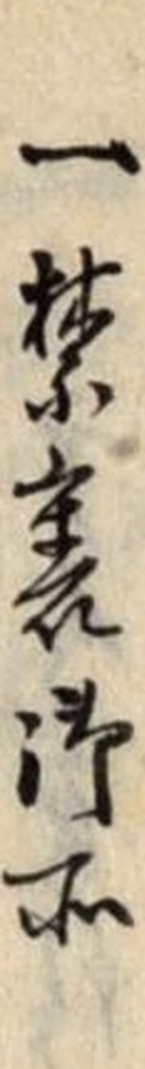一禁裏御所
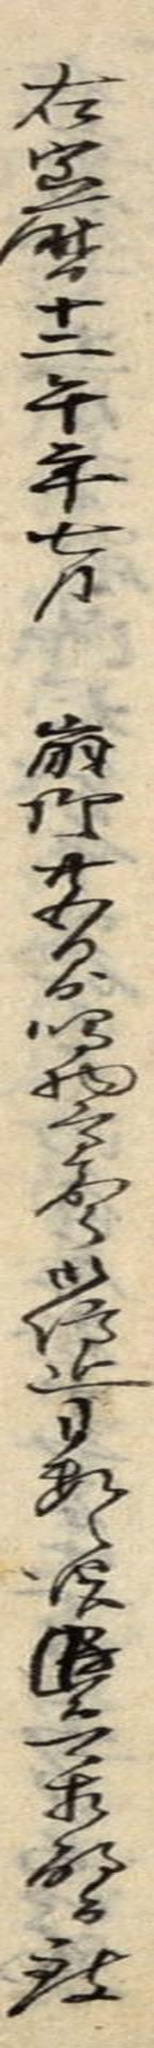右宝暦十二午年七月崩御廿五日ゟ鳴物高声御停止日数之儀は追て可相触候致
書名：御停止異変死失
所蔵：福井県文書館 Fukui Prefectural Archives
